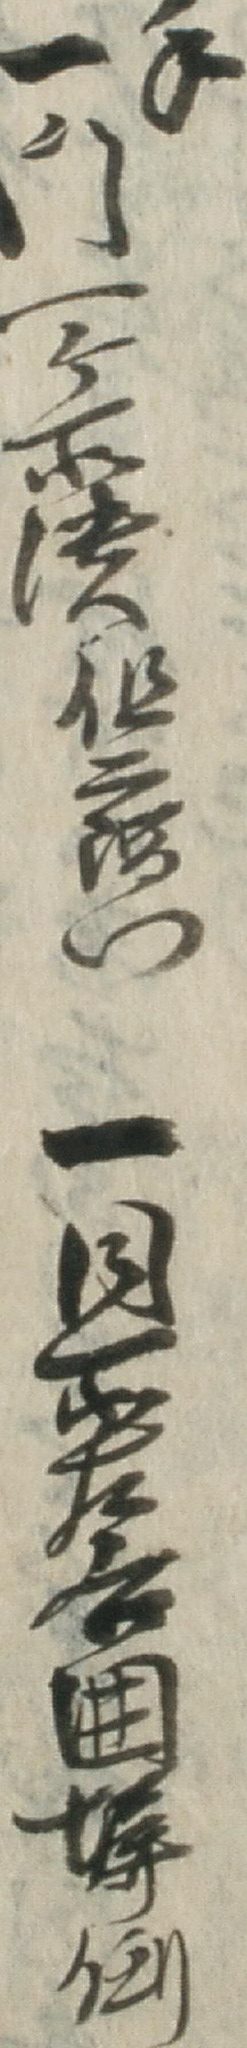一門一ヶ所潰但二階門一同所左右囲塀倒
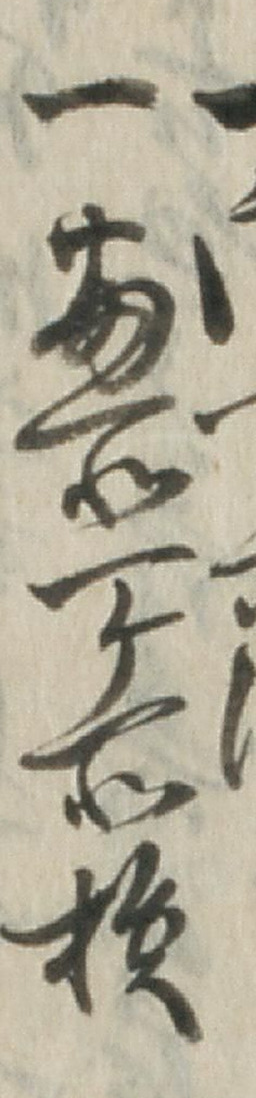一番所一ヶ所潰
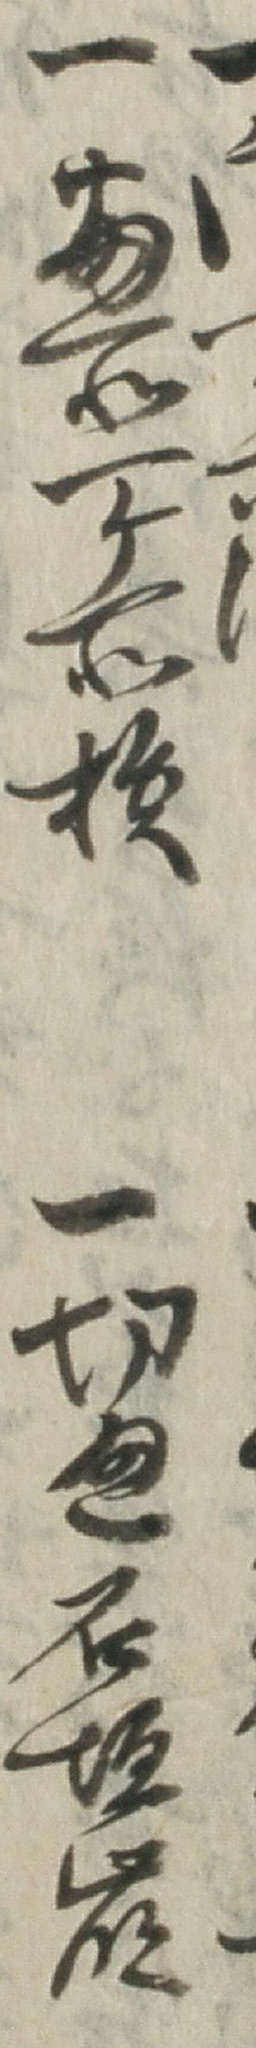一番所一ヶ所損一切通石垣崩
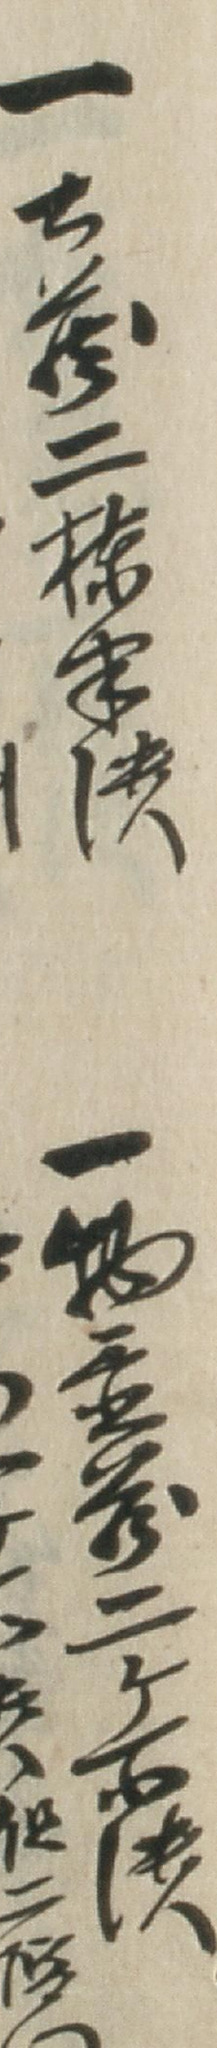一土蔵二棟半潰一物置蔵二ヶ所潰
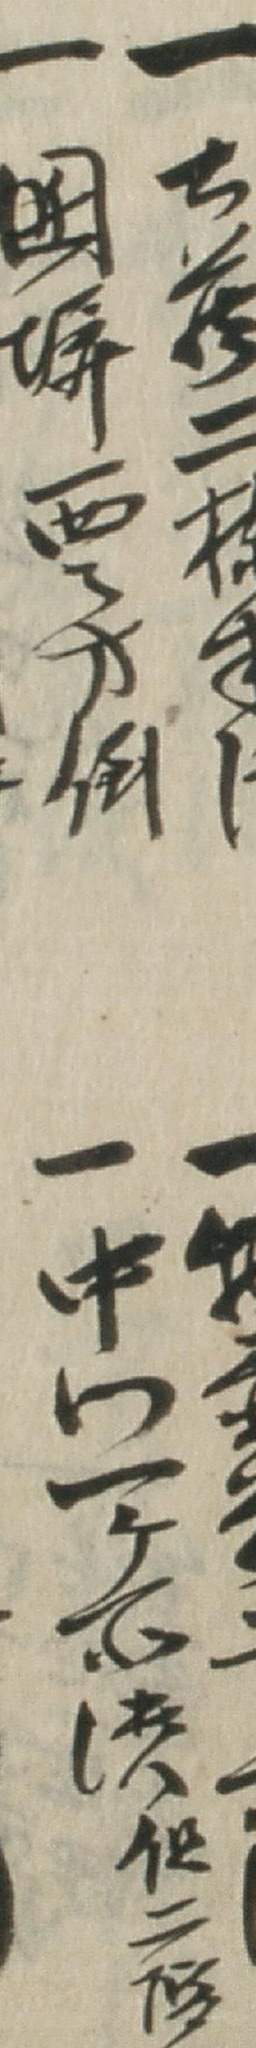一囲塀西之方倒一中門一ヶ所潰但二階門
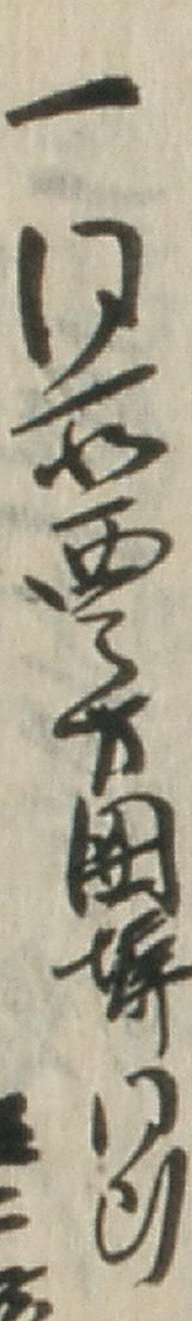一同所西之方囲塀同断
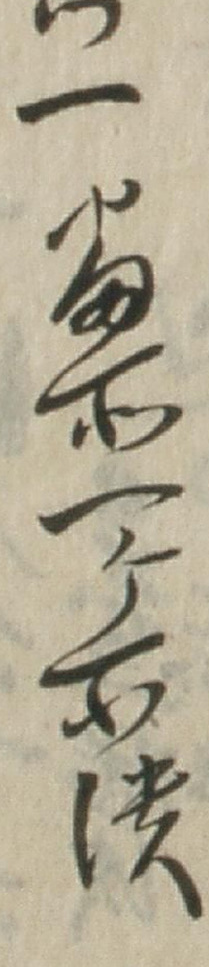一番所一ヶ所潰
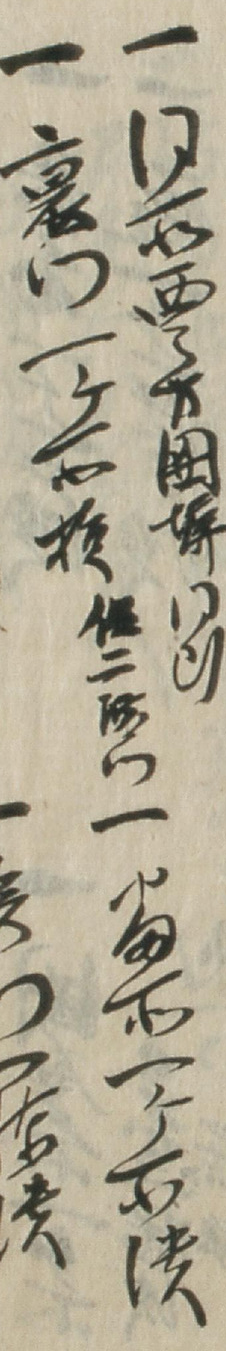一裏門一ヶ所損但二階一番所一ヶ所潰
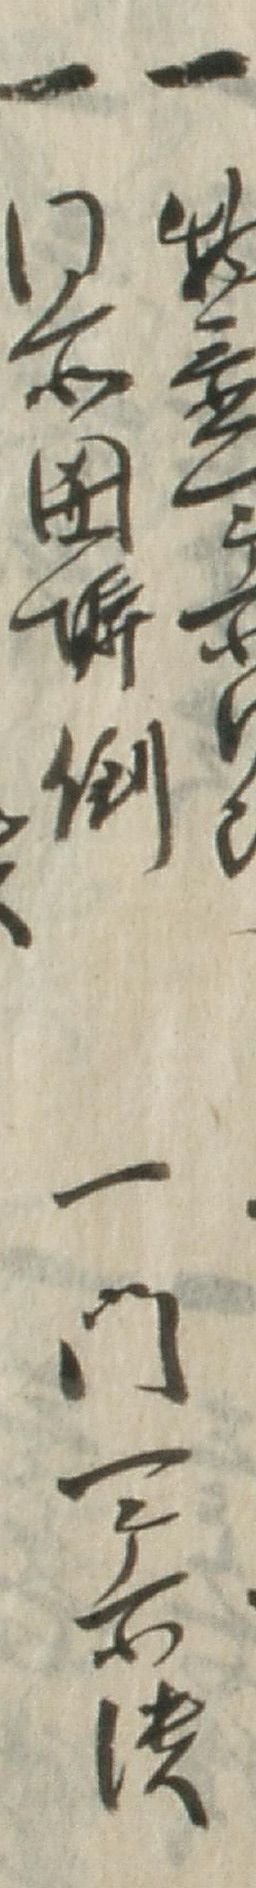一同所囲塀倒一門一ヶ所潰
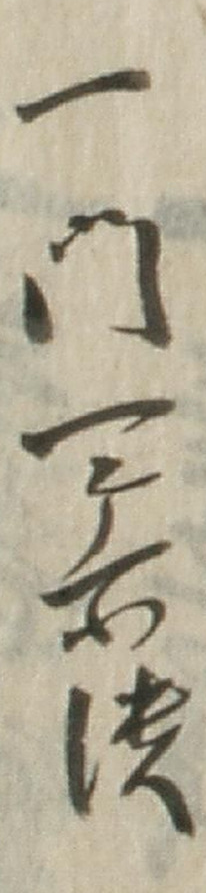一番所一ヶ所潰
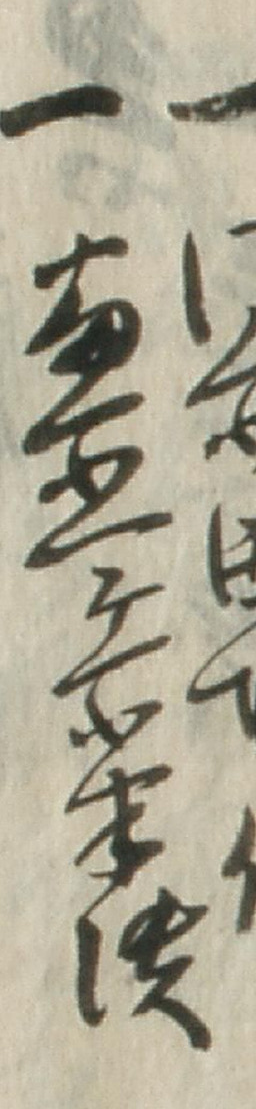一番所一ヶ所半潰
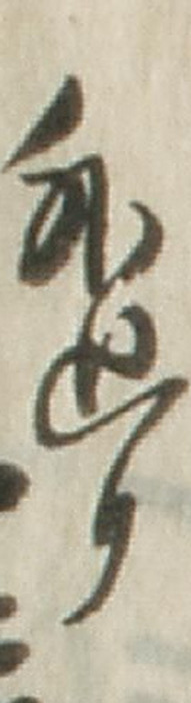外廻り
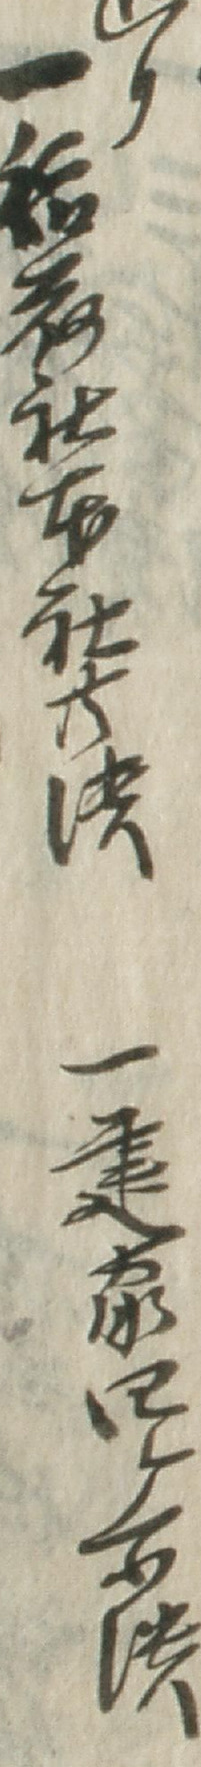一稲荷社本社共潰一建家四ヶ所潰
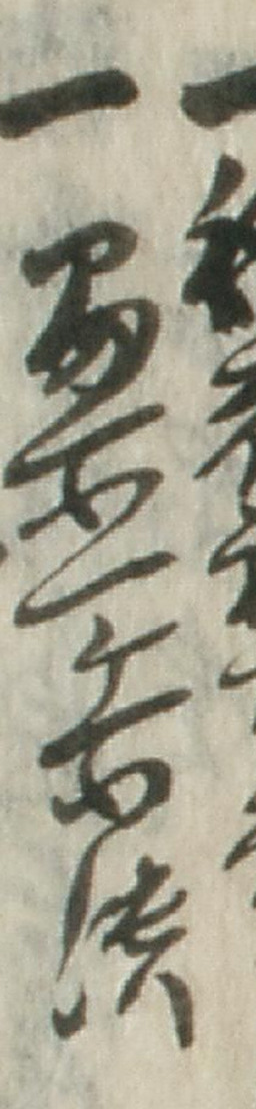一番所一ヶ所潰
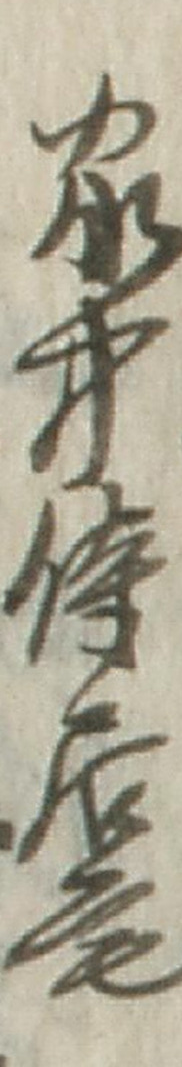家中侍居宅
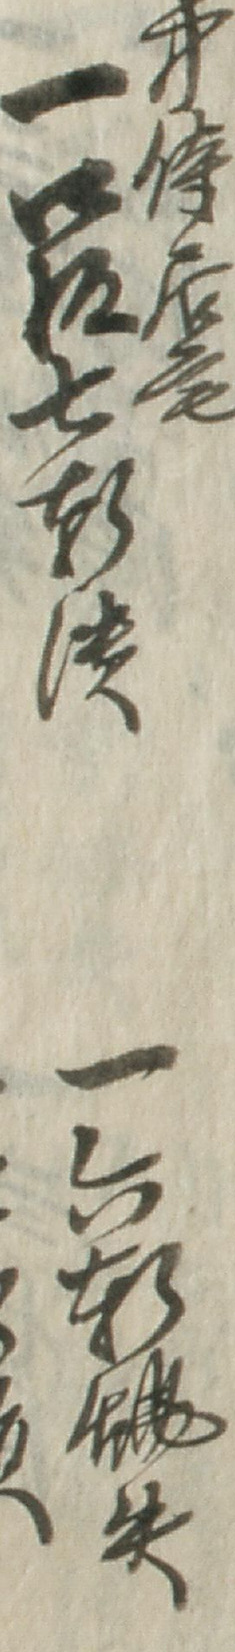一四拾七軒潰一六軒焼失
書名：信濃國地震實録記
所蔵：東京大学地震研究所図書室 Earthquake Research Institute Library, The University of Tokyo, JAPAN
